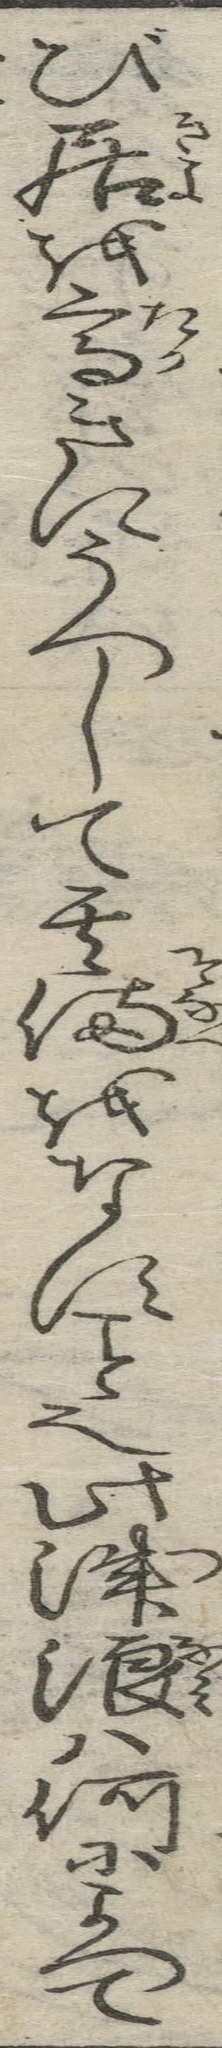び居を高きにうつして其備をなすこと也此津浪は何によつて
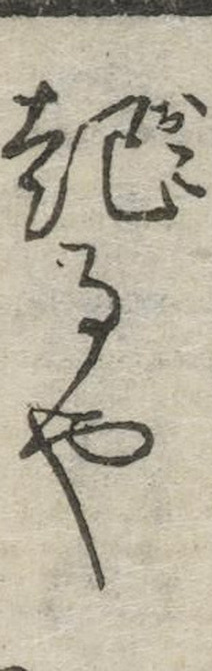起るや
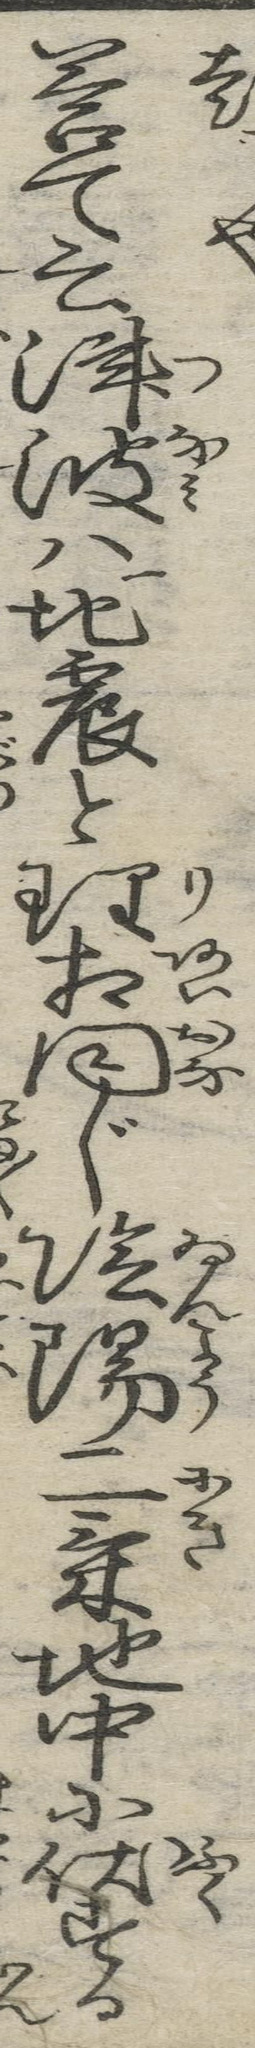答て云津波は地震と理相同じ陰陽二気地中に伏する
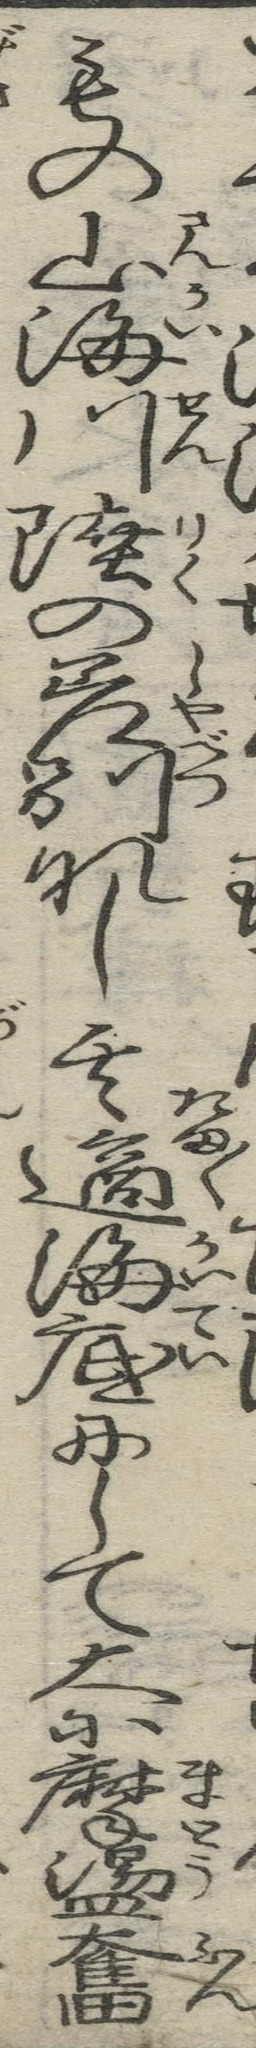もの山海川陸の差別なし其遍海底にして大小摩盪奮
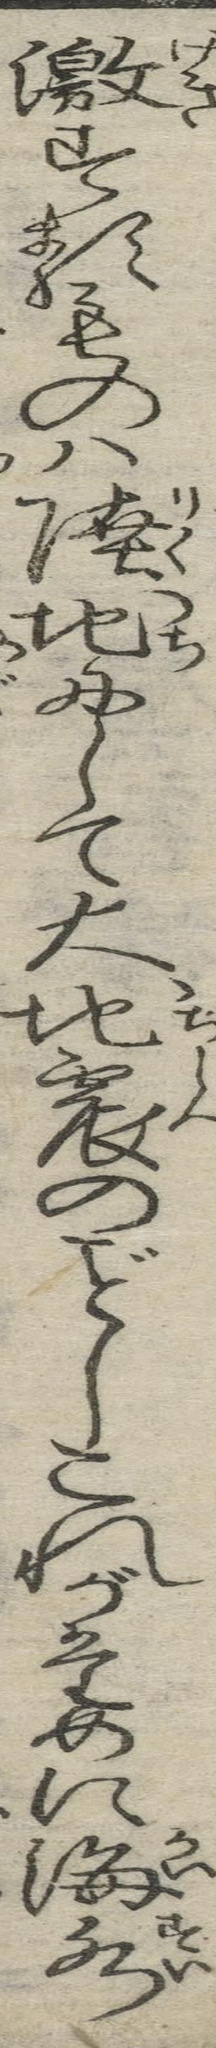激するものは陸地にして大地震のごとしこれがために海水
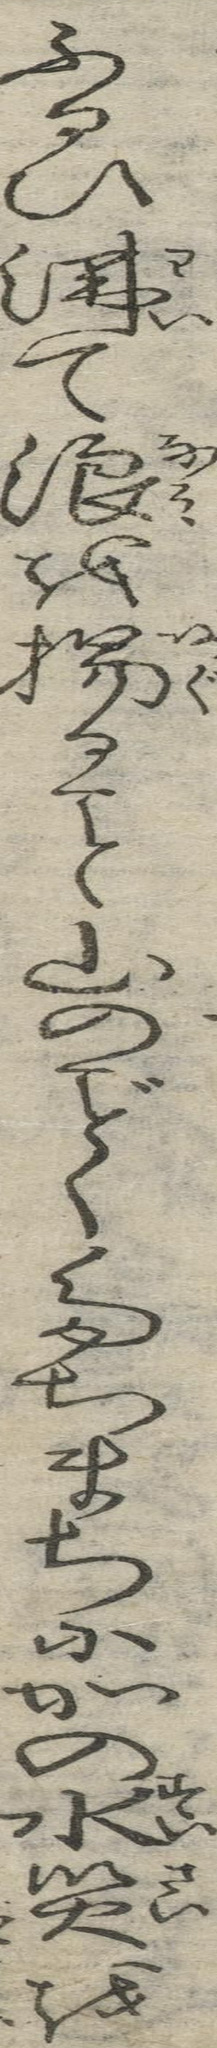ふるひ沸て浪を揚ること山のごとくたちまちにかの水災を
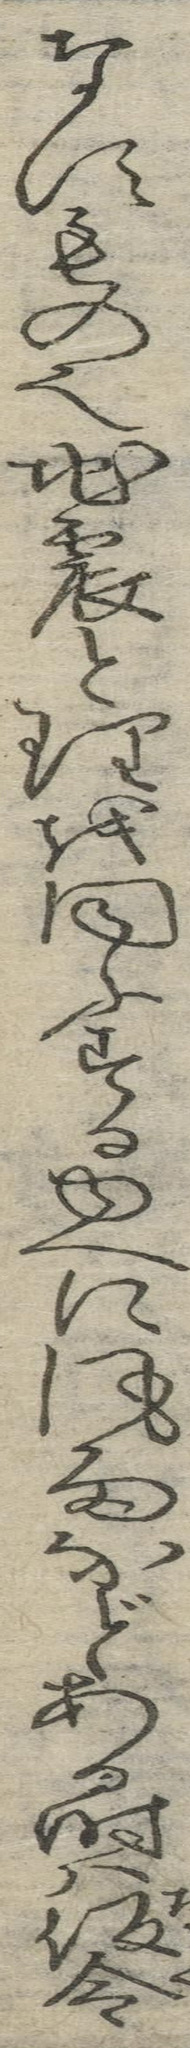なすもの也地震と理を同ふするゆへに風雨などある時は仮令

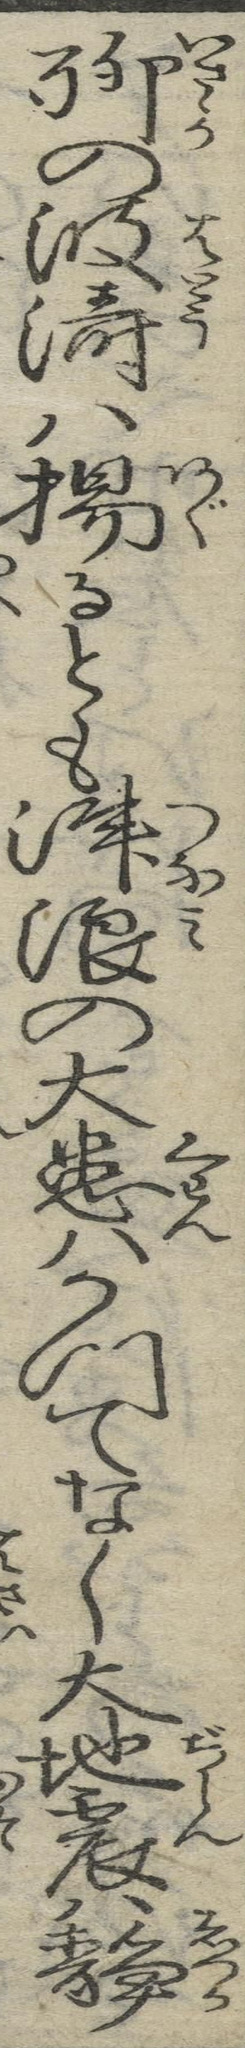聊の波濤は揚るとも津浪の大患はかつてなく大地震は静
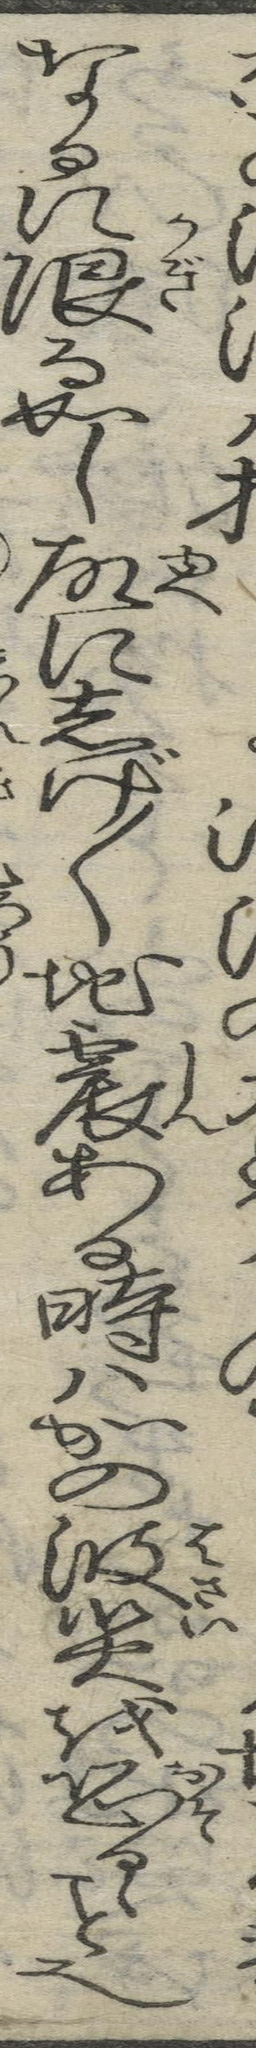なるに限るかし故にしげ〳〵地震ある時はかの波災を恐るヽこと也
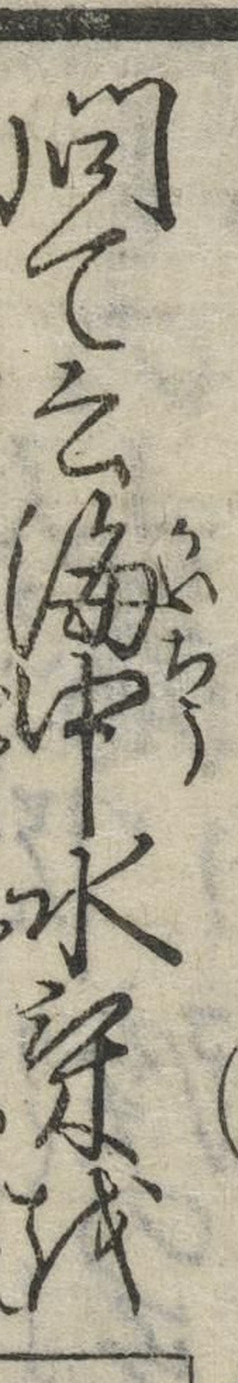問て云海中水気を
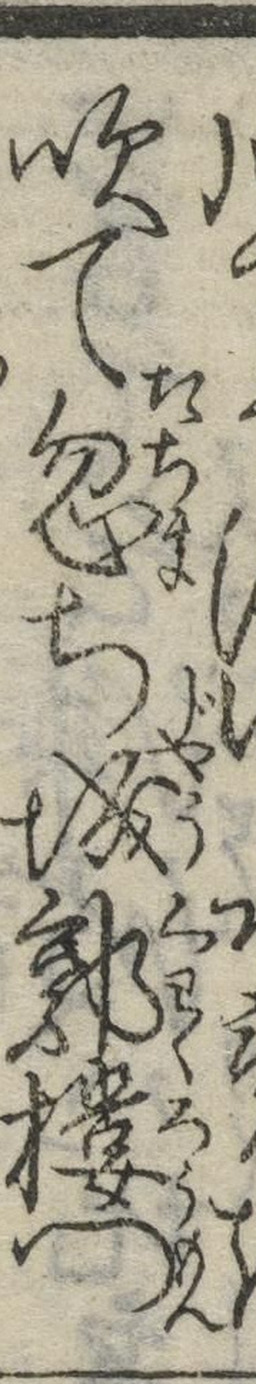吹て忽ち城郭樓門
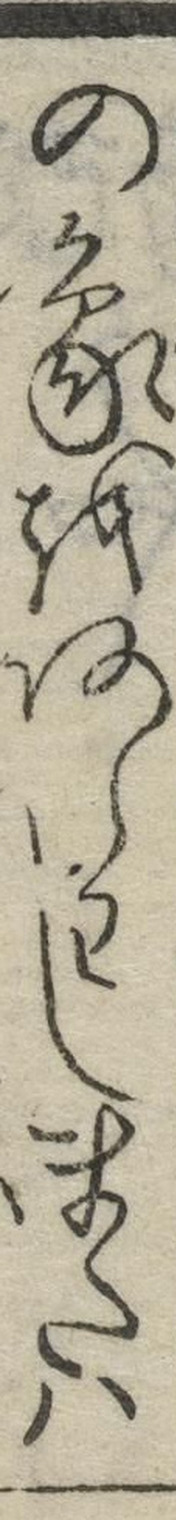の象をあらわしまたは
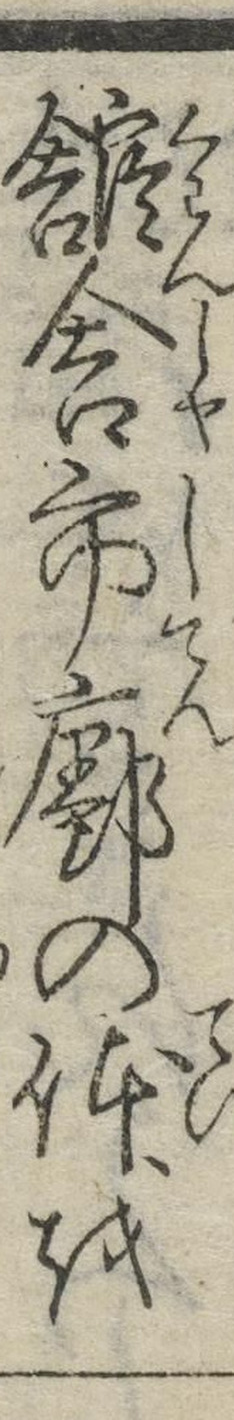館舎市鄽の体を
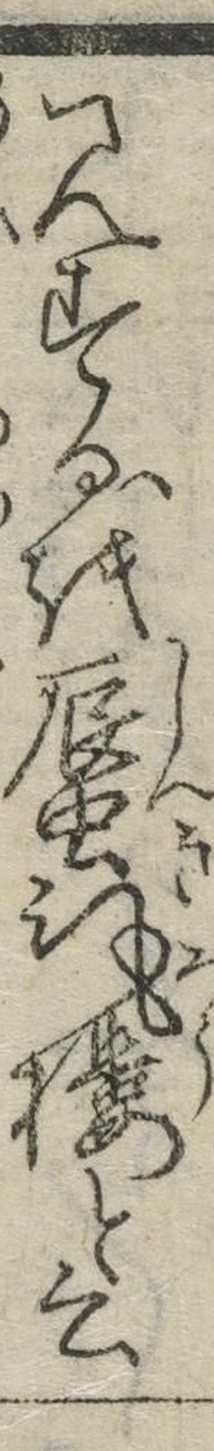見するを蜃気樓と云
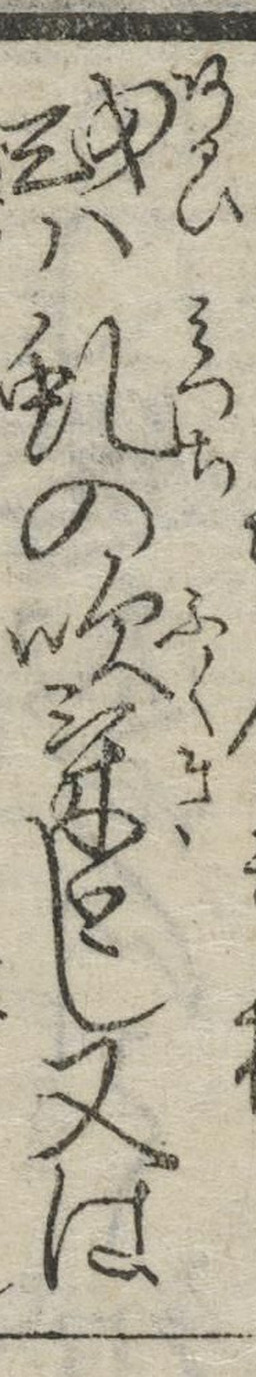或は虬の吹気とし又は
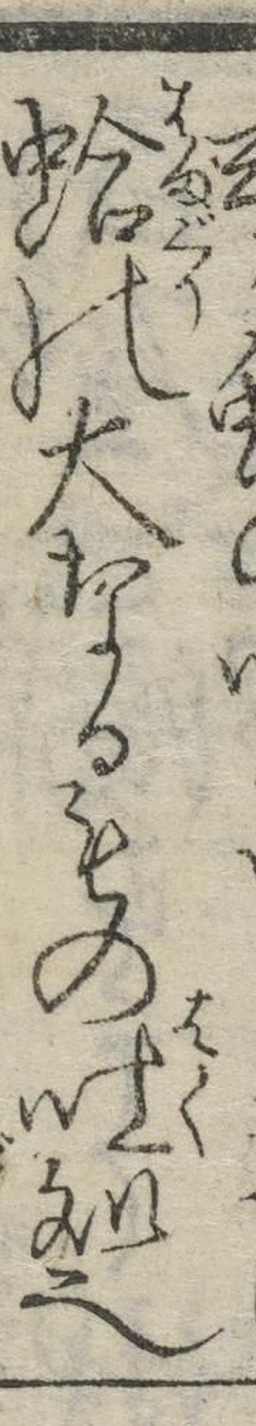蛤の大なるもの吐処也
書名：訓蒙天地辨　地
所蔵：東京大学地震研究所図書室 Earthquake Research Institute Library, The University of Tokyo, JAPAN
